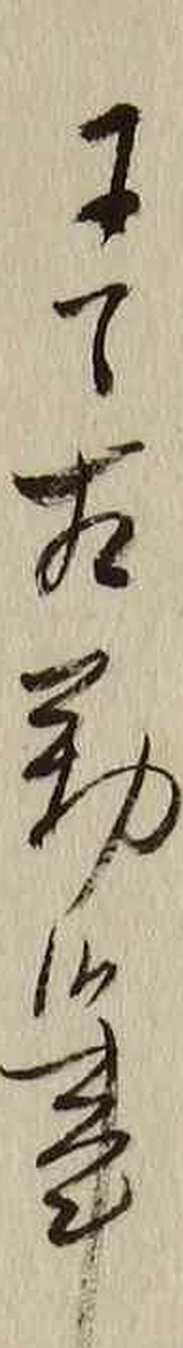にて相勤候事
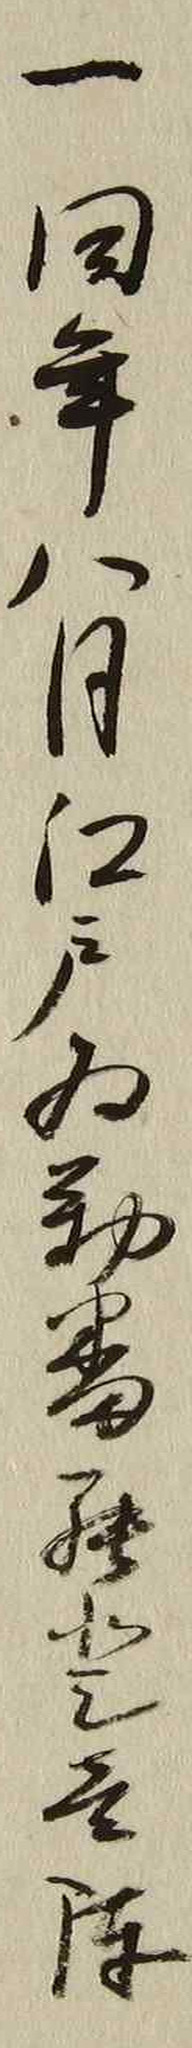一同年八月江戸為勤番罷登壱陣
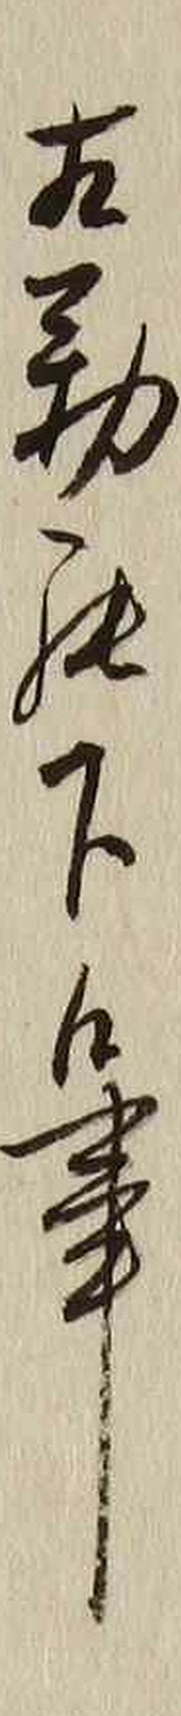相勤罷下候事
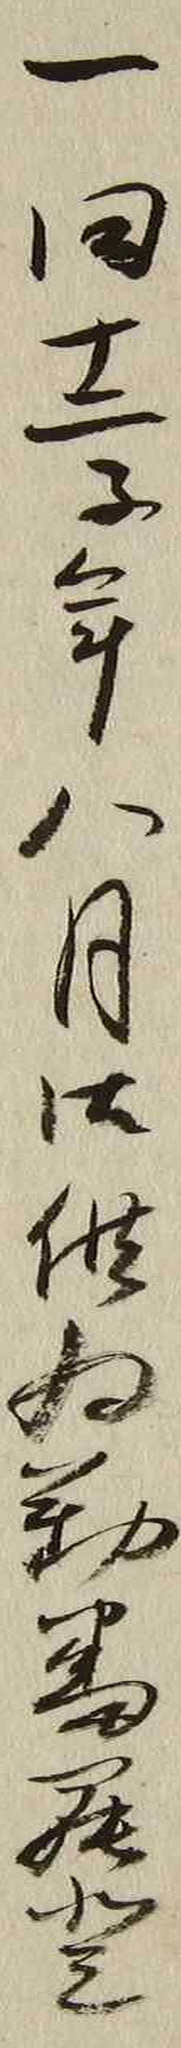一同十二子年八月御供為勤番罷登
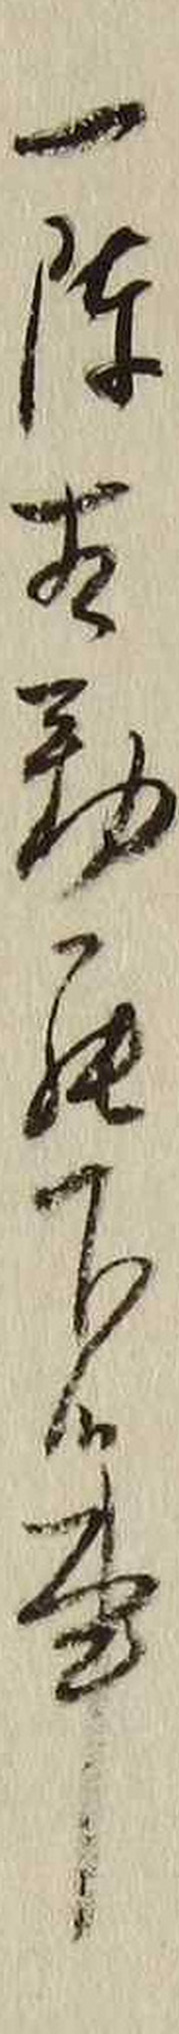一陣相勤罷下候事
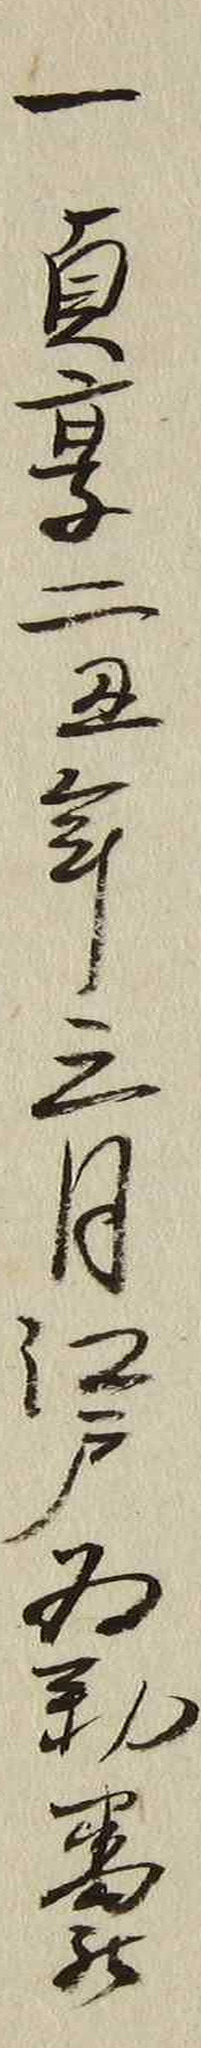一貞享二丑年三月江戸為勤番罷
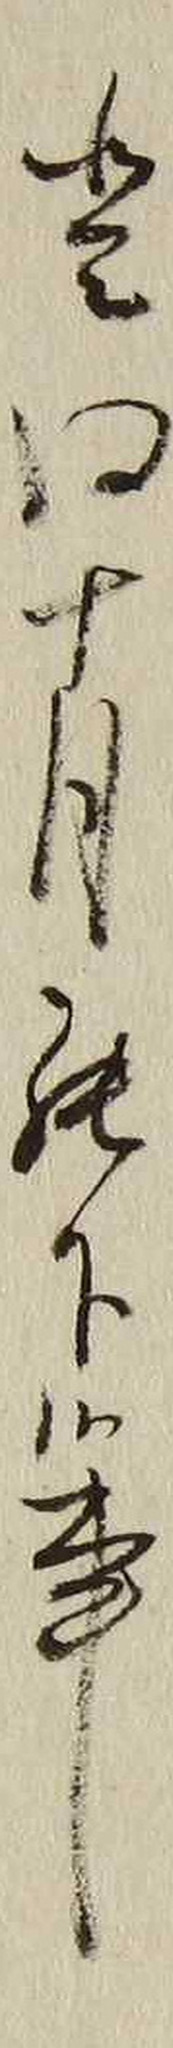登同十月罷下候事
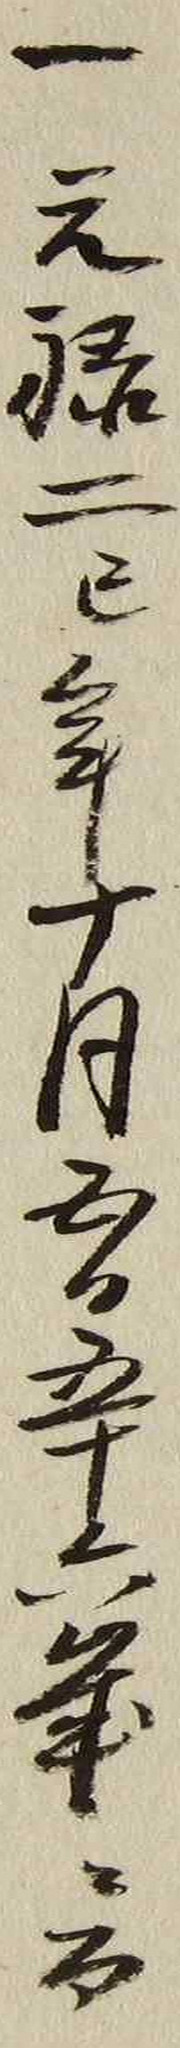一元禄二巳年十月五日五十六歳ニ而
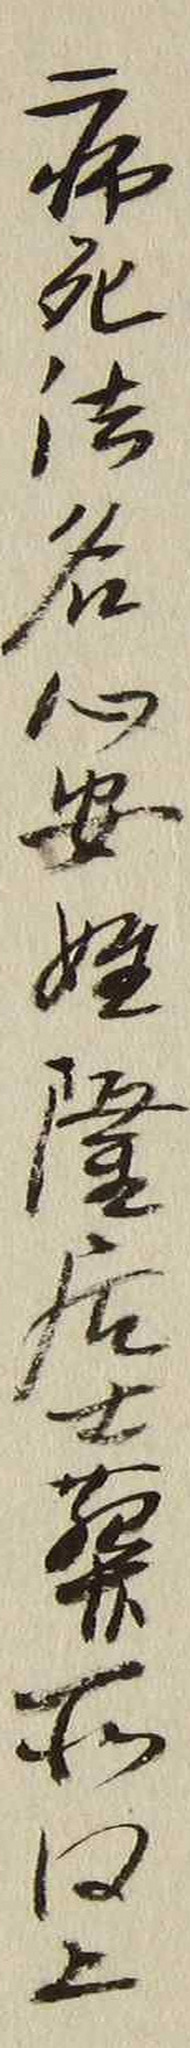病死法名心安姓隆居士葬所同上
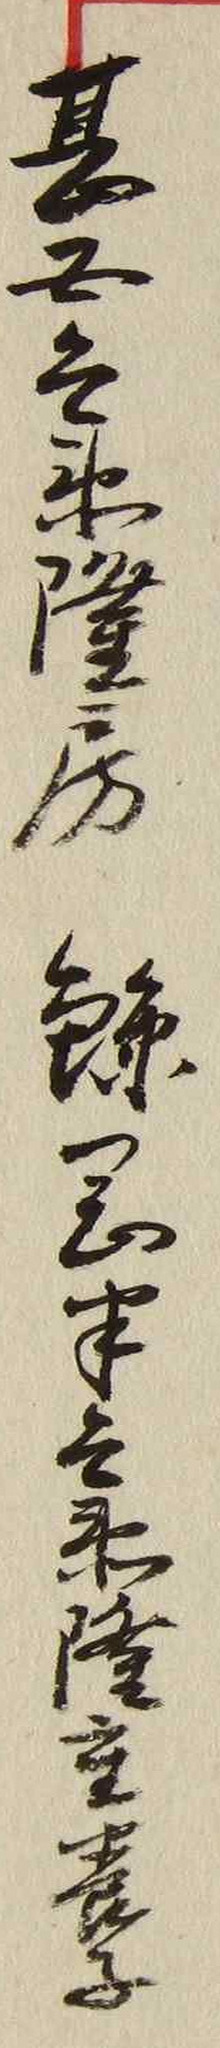甚五兵衛隆房鯨岡半兵衛隆重養子

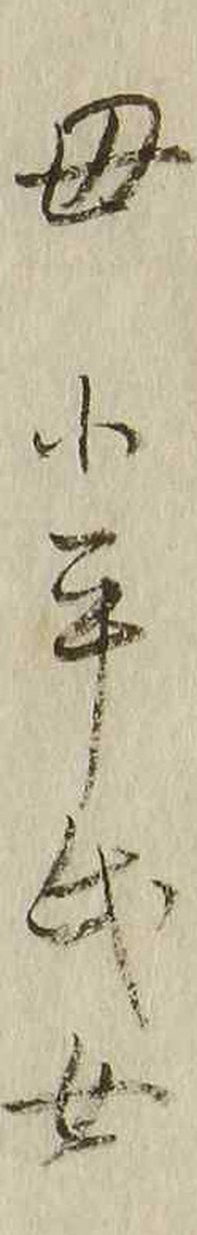母小平氏女
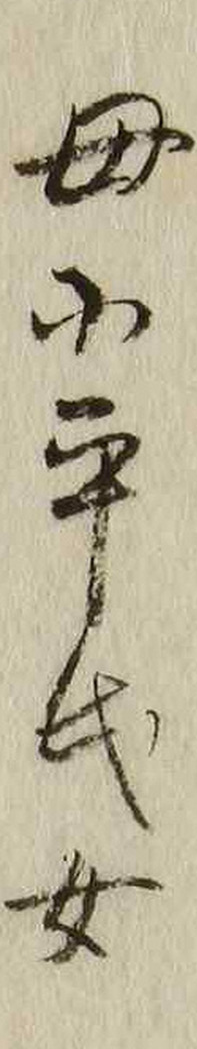母小平氏女
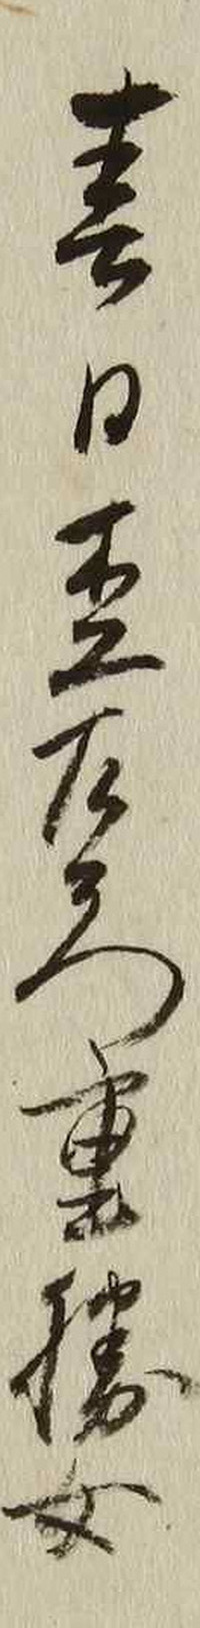春日杢左衛門重勝女
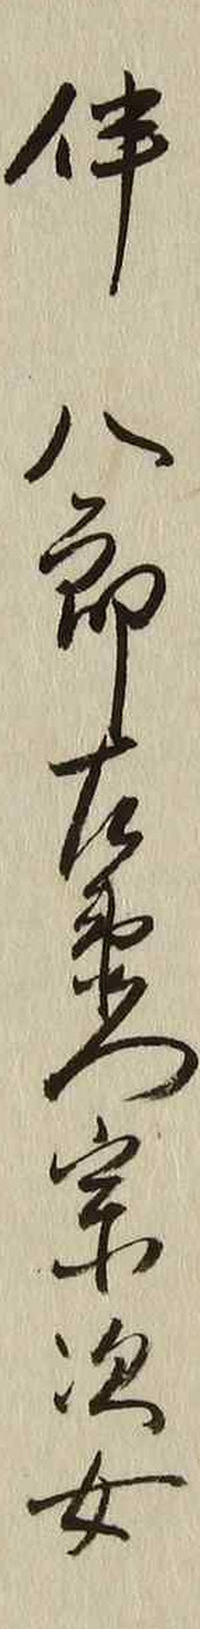伴八郎左衛門宗次女
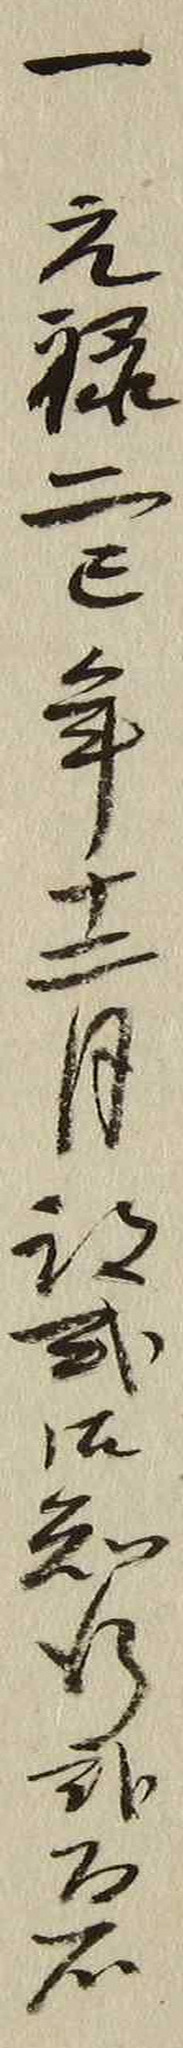一元禄二巳年十二月跡式御知行弐百石
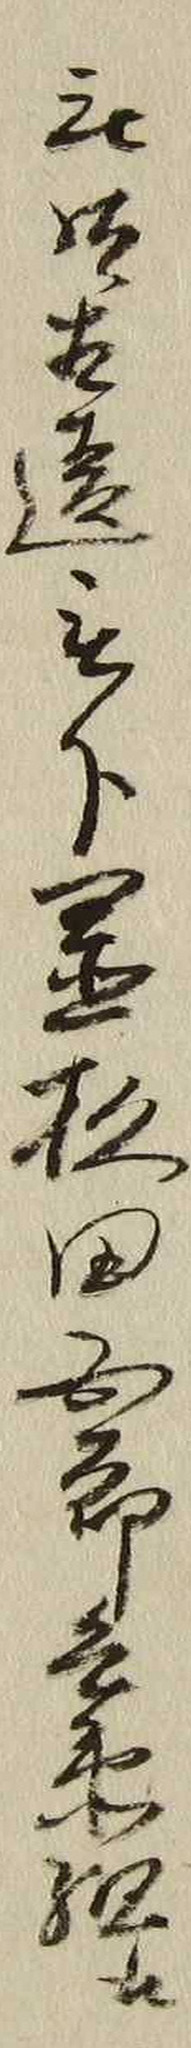被御相違被下置杉田五郎兵衛組江
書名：諸士系譜　巻之349　も之部5
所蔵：会津若松市立会津図書館
